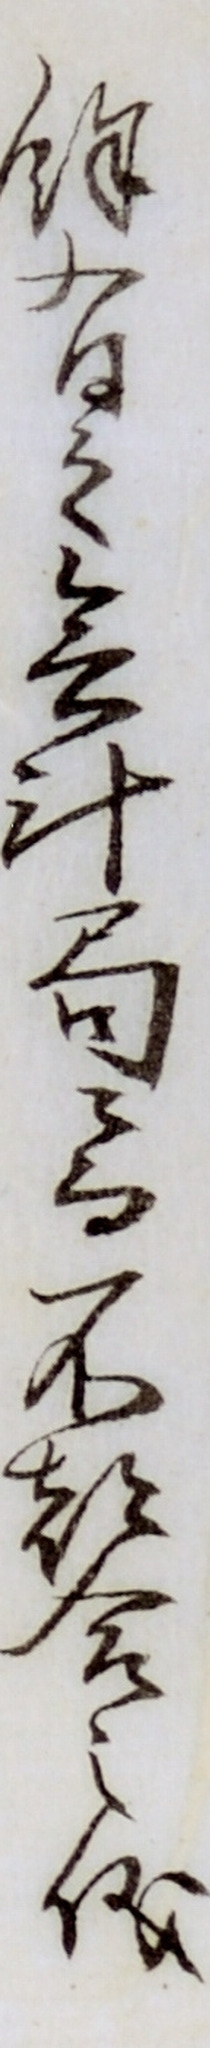余有之会計局にて不都合之儀
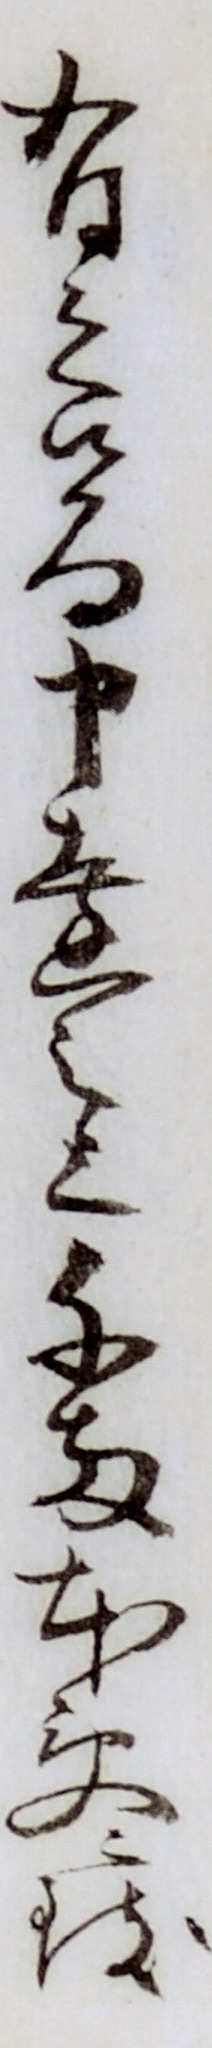有之候間申達候之上千両本受に致
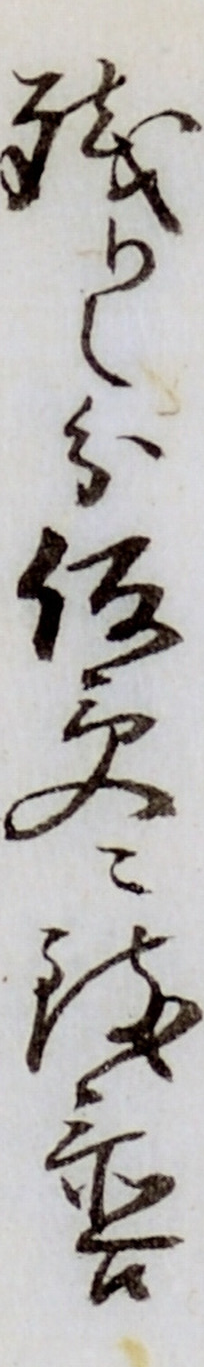残り之分仮受に致置候
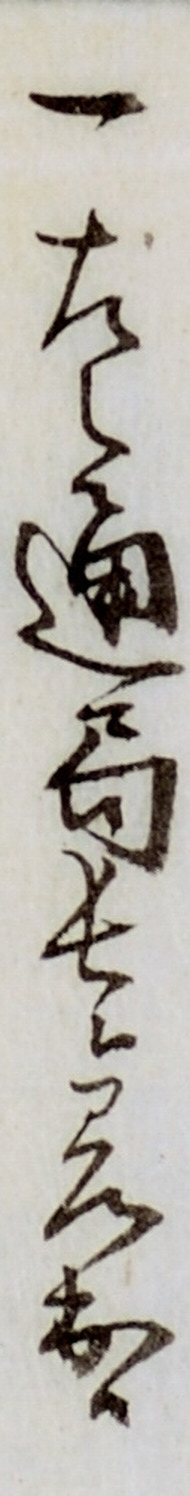一左之通局長え差出候
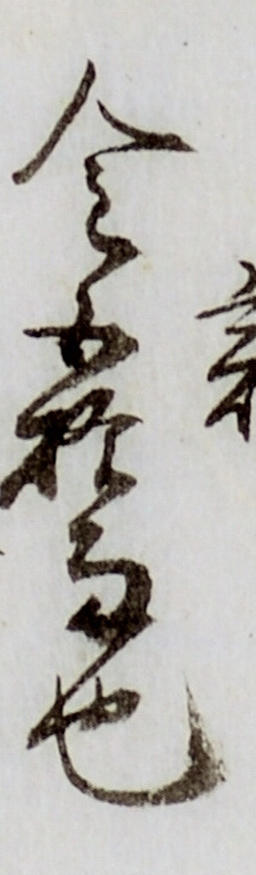金五拾両也
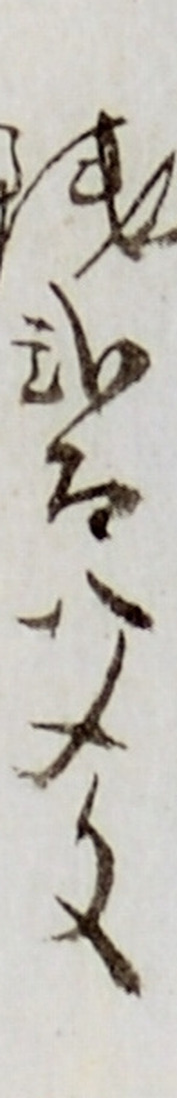銭弐百八貫文
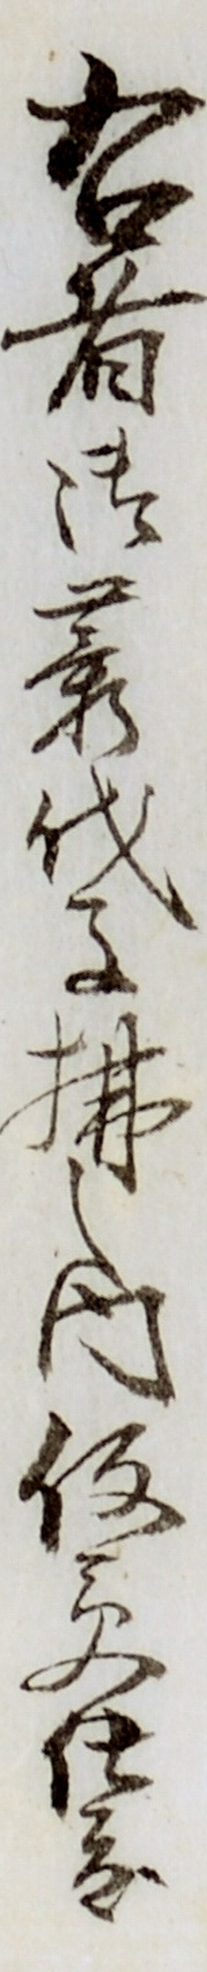右は御薪伐子払之内仮受仕度
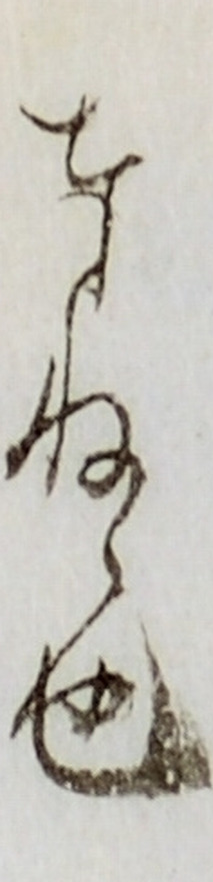奉存候也
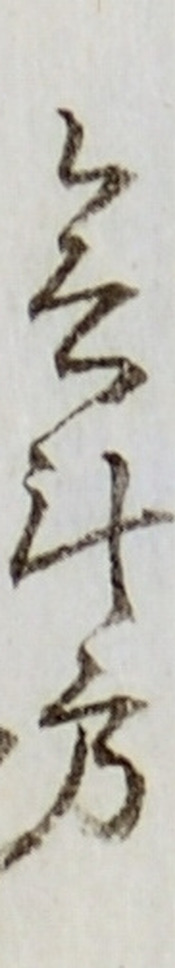会計方
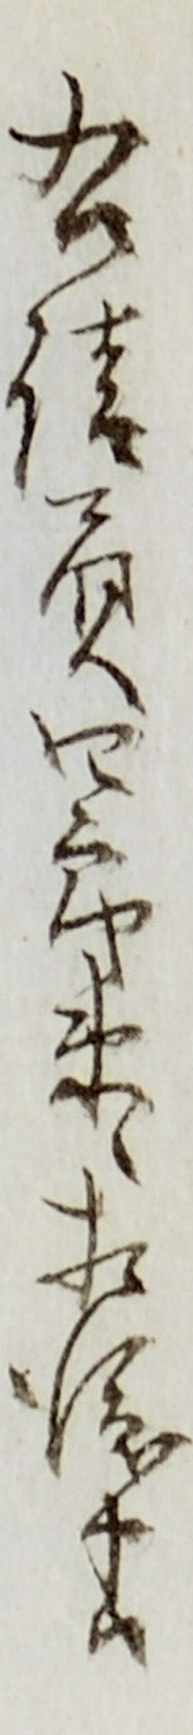右請負四郎衛へ相渡申候
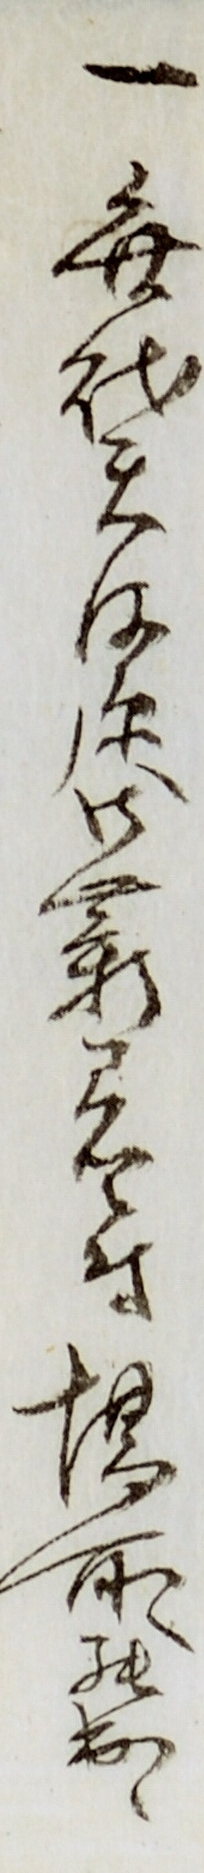一弁財天河原へ御薪着に付場所へ罷出候
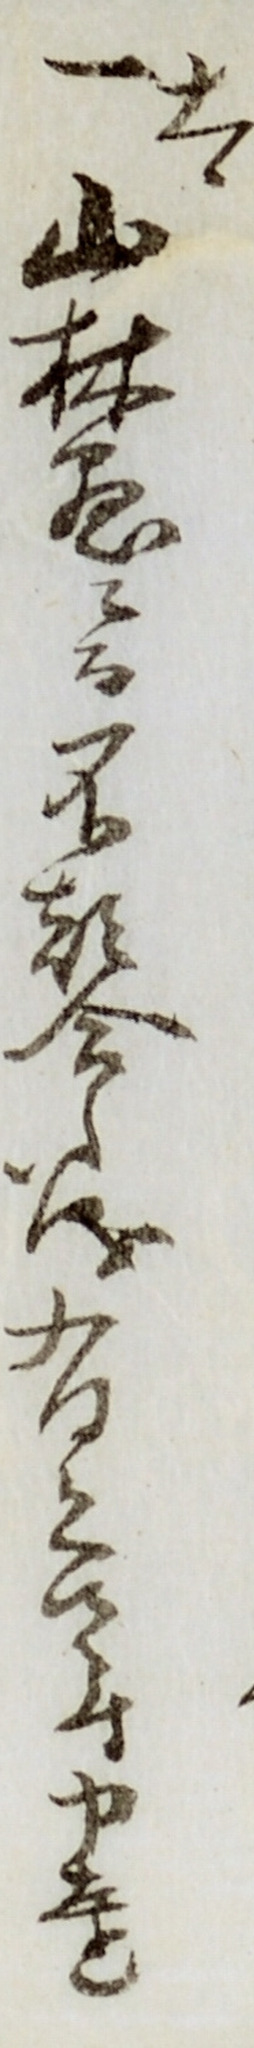一山林懸にて不都合之儀有之候に付申達
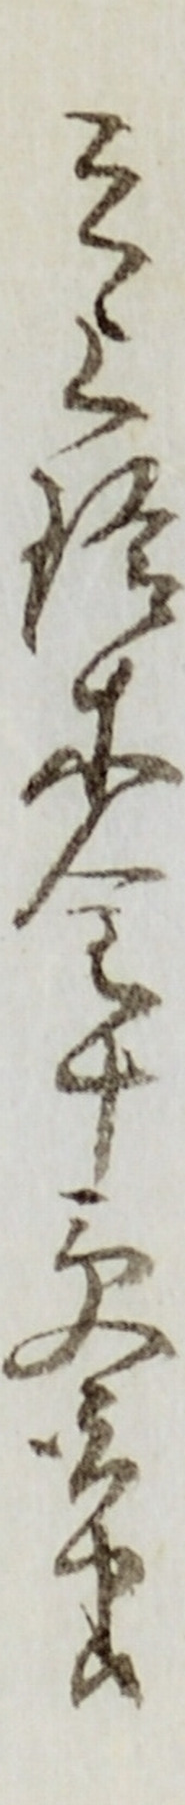之上鈴木金十受取申候
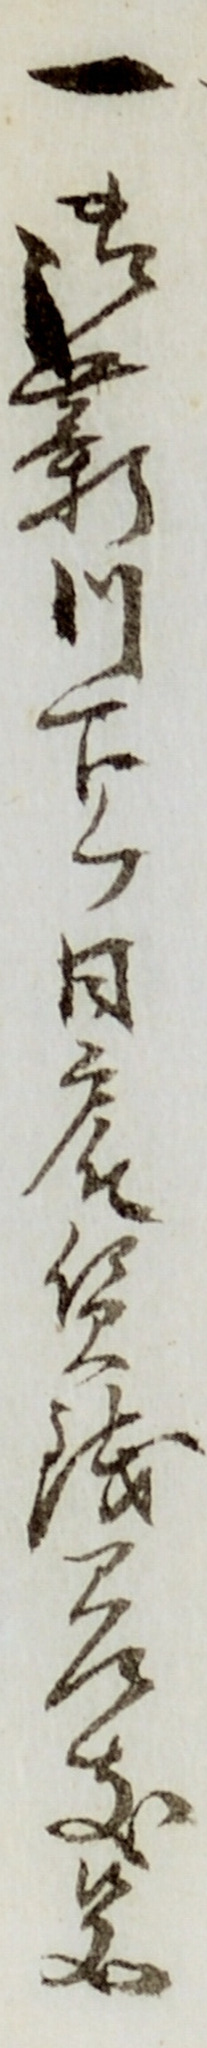一御薪川下ヶ日雇賃銭差支候処
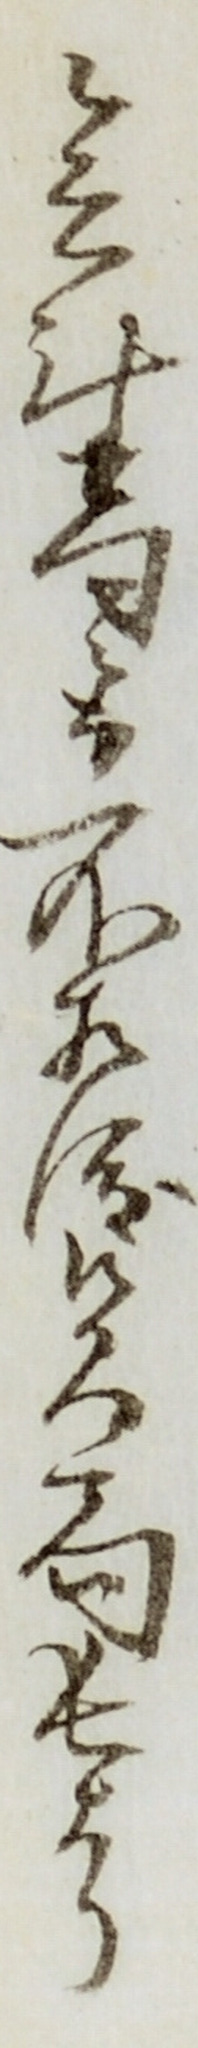会計局にて不相渡候間局長より
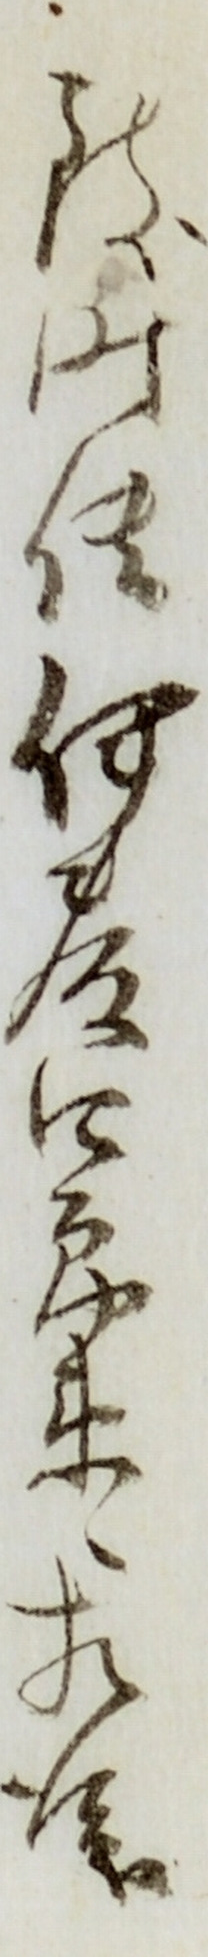致時借伊藤四郎衛へ相渡
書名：山林方諸事御用留
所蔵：伊那市立高遠町図書館・合同会社AMANE
